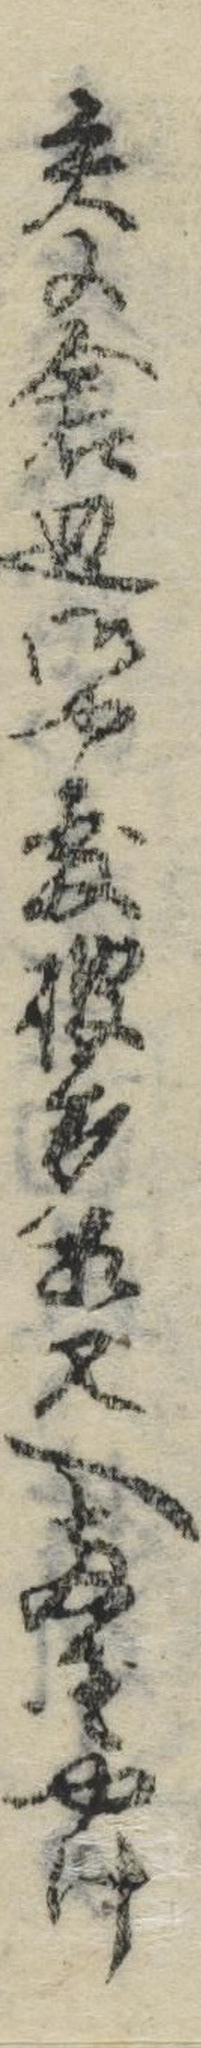家の倉辺御や敷破多く相見へ両国やけ
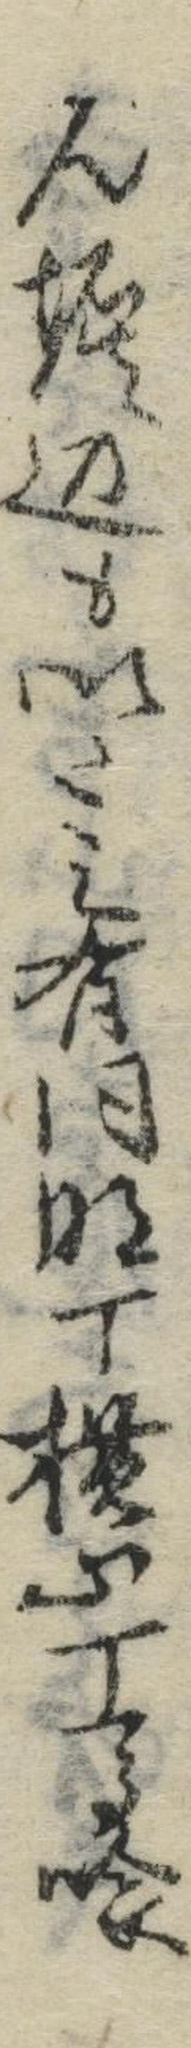ん堀辺もいたみ有同明丁横心丁馬喰
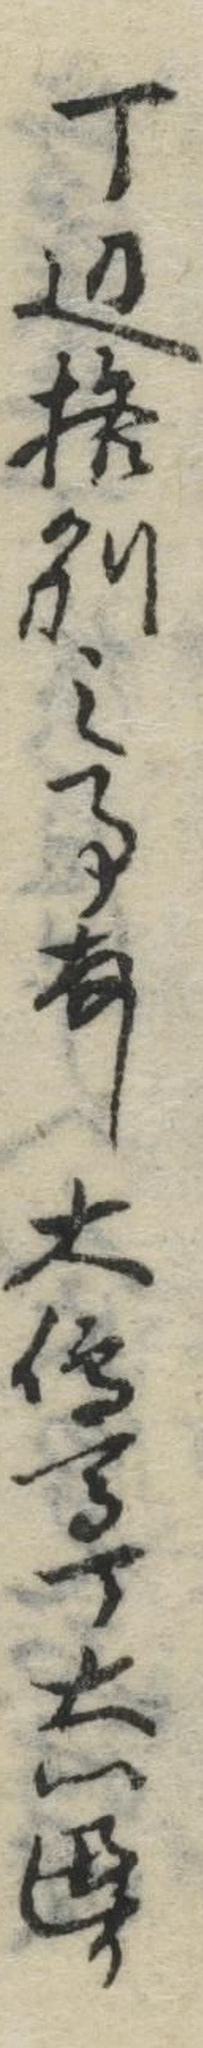丁辺格別之事なし大伝馬丁大川通り
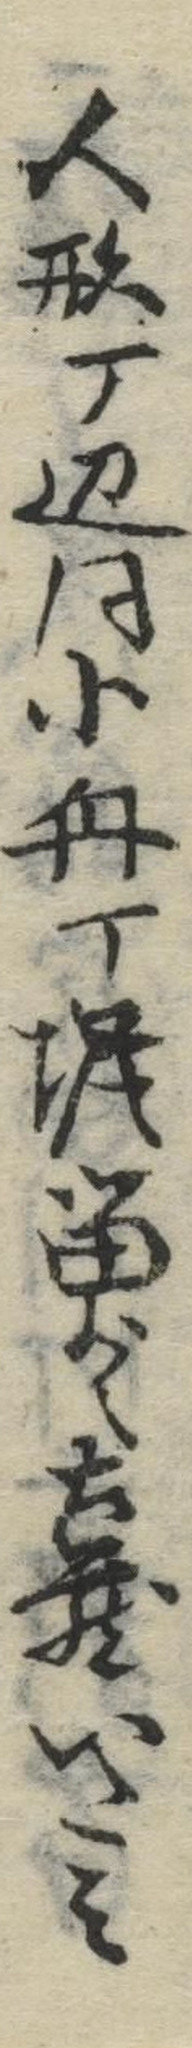人形丁辺同小舟丁塀留少々土蔵いたミ
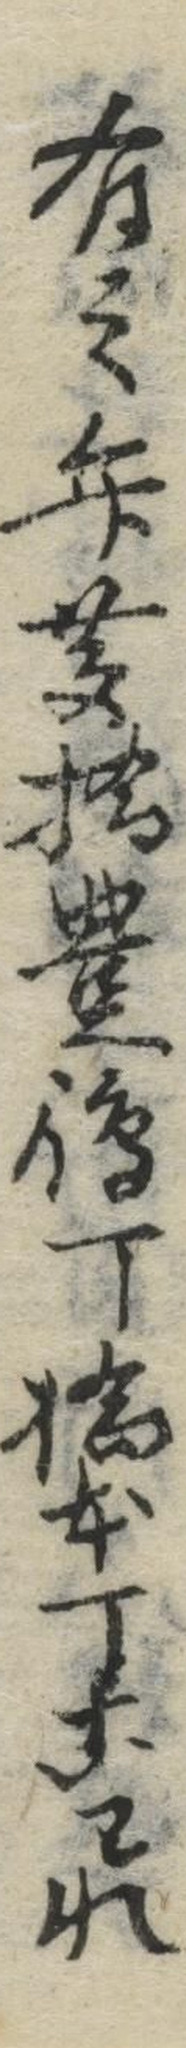有之弁慶橋豊嶋丁橋本丁こわれ
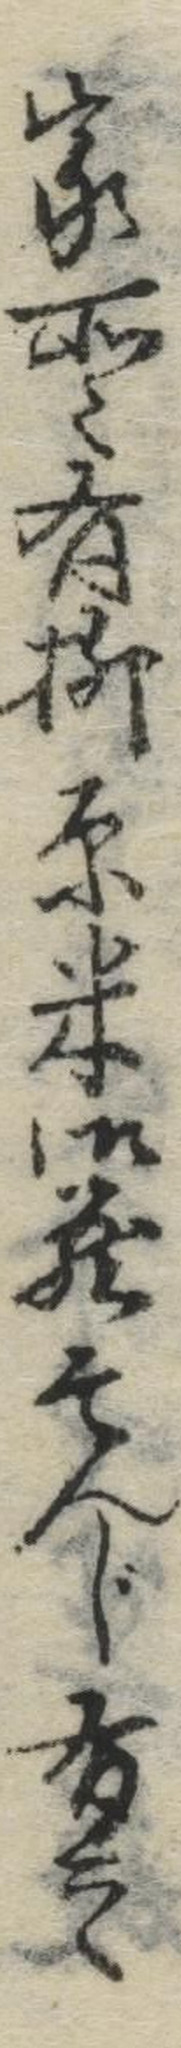家所々有柳原米御蔵そんじ有之
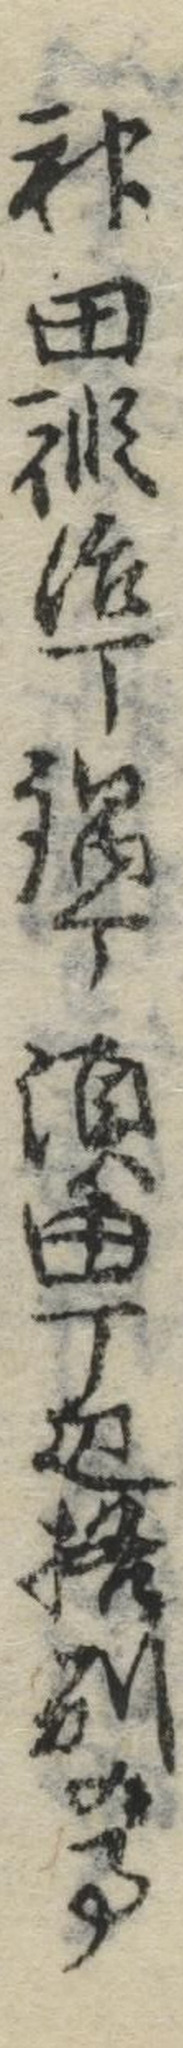神田鍛冶丁鍋丁須田丁辺格別の事
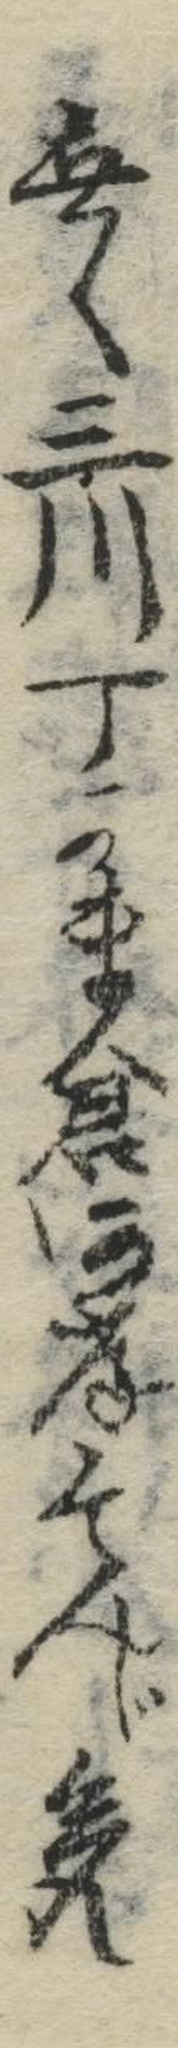無く三川丁かま倉河岸そんじ多し
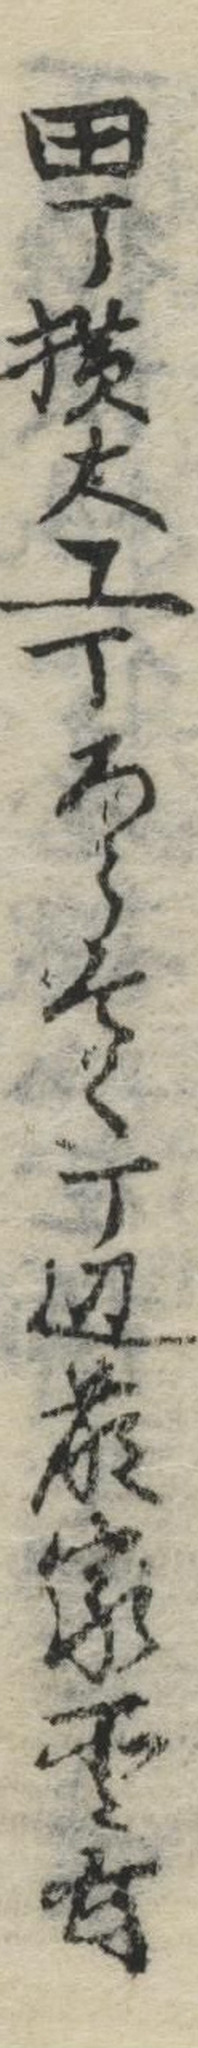田丁横大工丁ろうそく丁辺崩家所々有
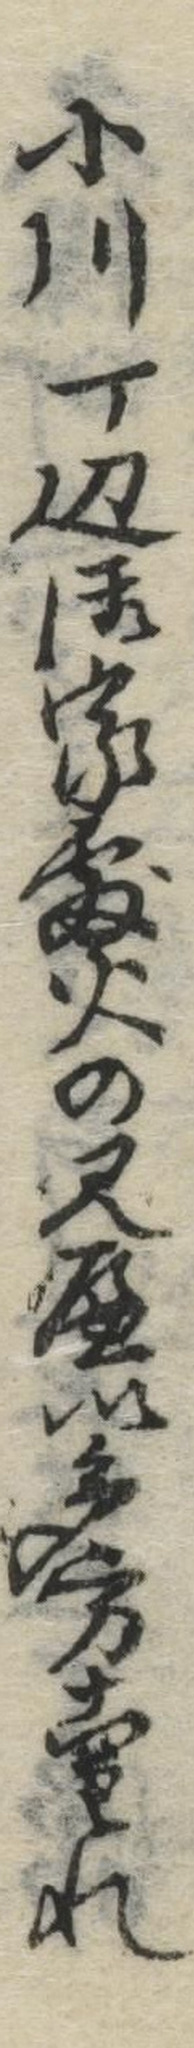小川丁辺御家敷火の見へい多方こわれ
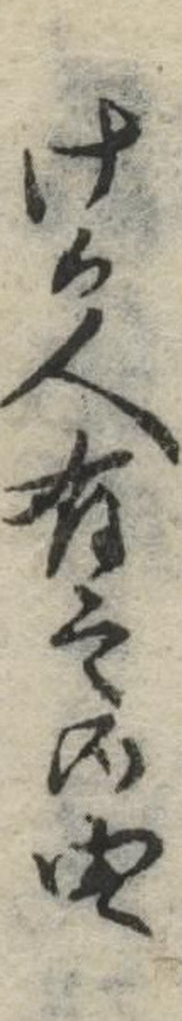けか人有之候由
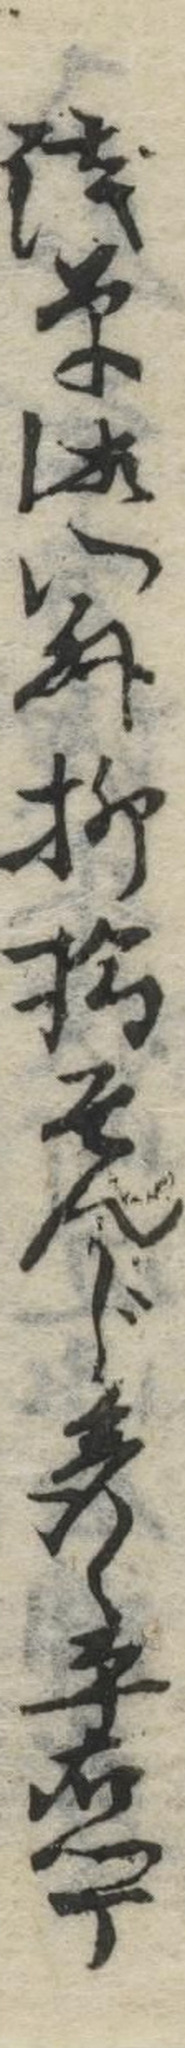浅草御門外柳橋そんじ多く平右衛門丁
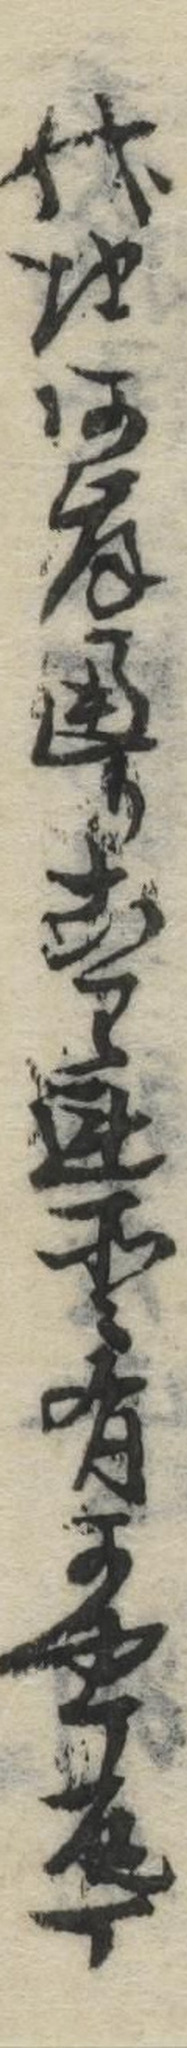代地河岸通りこわれ所々有かや丁瓦丁
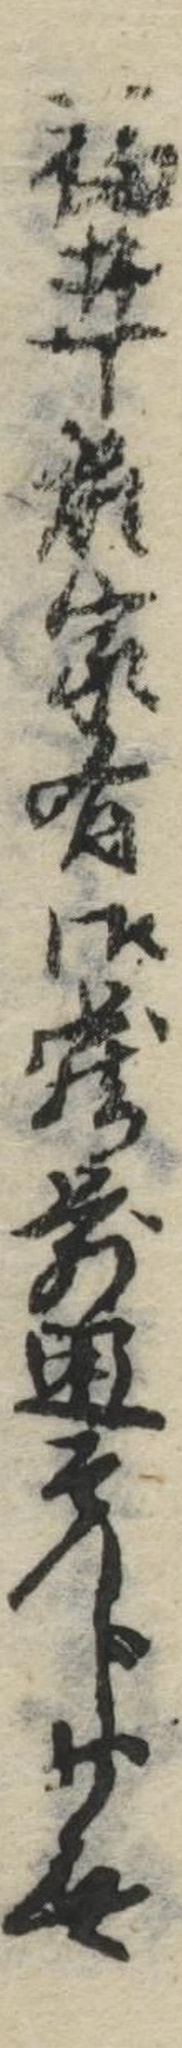福井丁崩家有御蔵前通そんじ少無
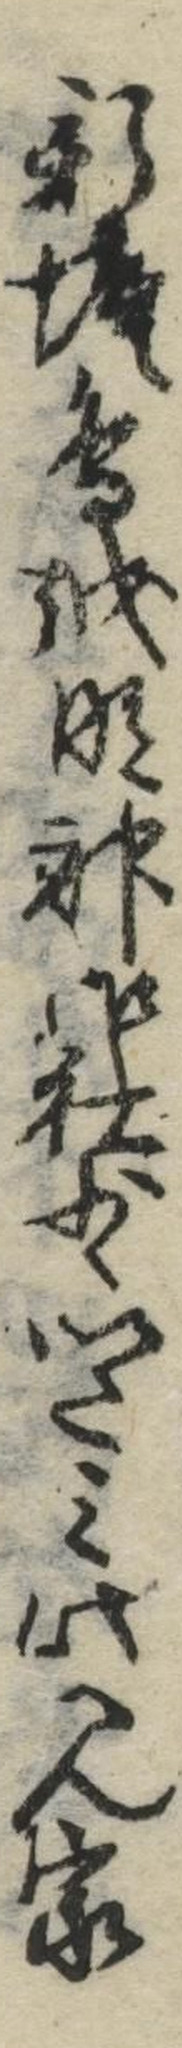新堀鳥越明神御社少々いたミ此へん家
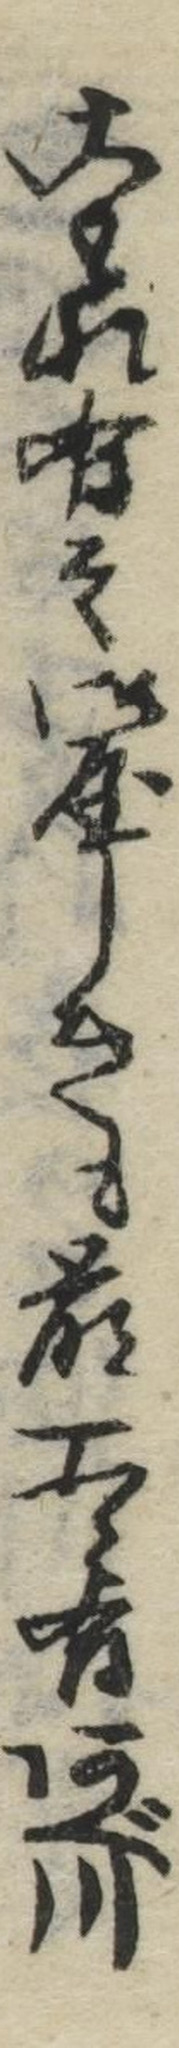こわれ有之御やしきも崩所々有阿べ川
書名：安政三年辰八月廿五日夜　大江都御屋敷方寺社市中共　大嵐水入場所明細書之寫　并街道筋近郷聞書
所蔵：東京大学地震研究所図書室 Earthquake Research Institute Library, The University of Tokyo, JAPAN
